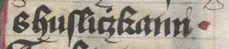s huſlicżkami.
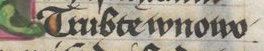Trubte wnowo¬
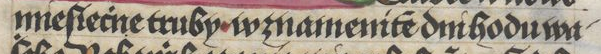mieſieċne truby.wznamenitē dni hodu wa¬
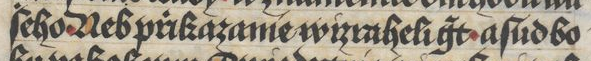ẛeho.Neb pṙikazanie wizraheli ḡt. a ſud bo¬
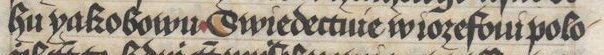hu yakobowmu.Swiedectuie w iozefoui polo¬
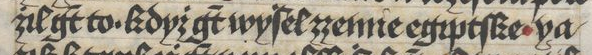żil ḡt to.kdyż ḡt wyẛel zzemie egiptſke.ya¬
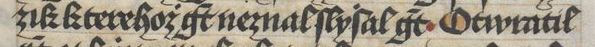zik kterehoż ḡt neznal ſlyẛal ḡt. Otwratil
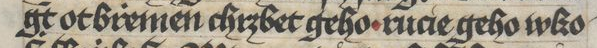ḡt otbṙemen chrzbet geho.rucie geho wko¬
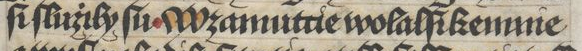ẛi ſlużily ſu.Wzamutcie wolalſi kemnie
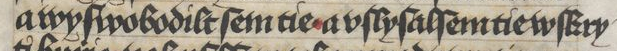a wyswobodilt ſem tie.a uſlyſalſem tie wſkry¬
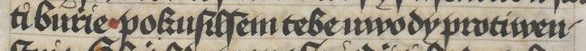ti buṙie.pokuſilſem trbe uwody protiwen¬
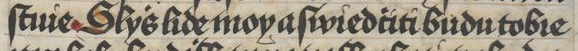ſtuie.Slyṡ lide moy a ſwiedčiti budu tobie¬
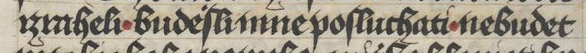izrahelu.budeẛli mne poſluchati.nebudet
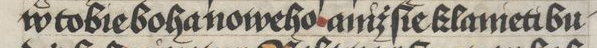w tobie boha noweho.aniż ſie klanieti bu¬
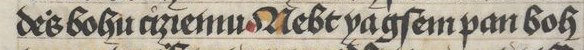deṡ bohu ciziemu.Nebt ya gſem pan boh
